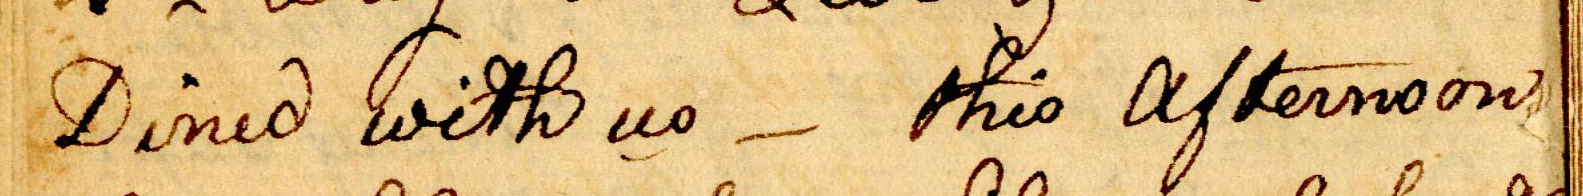Dined with us- this Afternoon
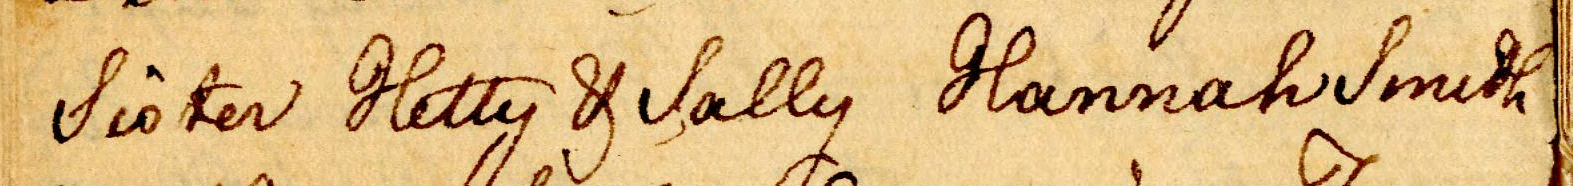Sister Hetty & Sally Hannah Smith
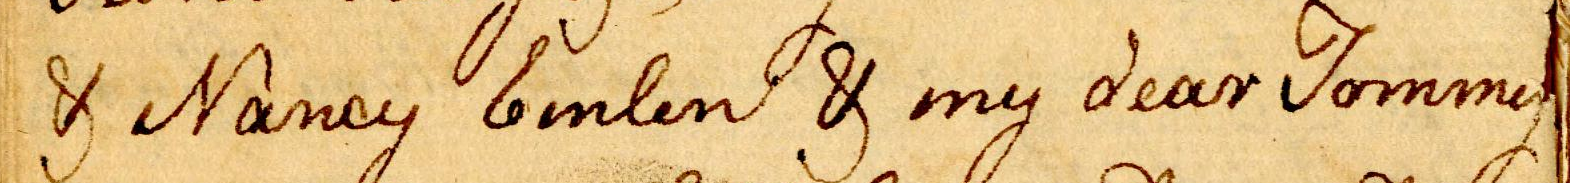& Nancy Emlen & my dear Tommy
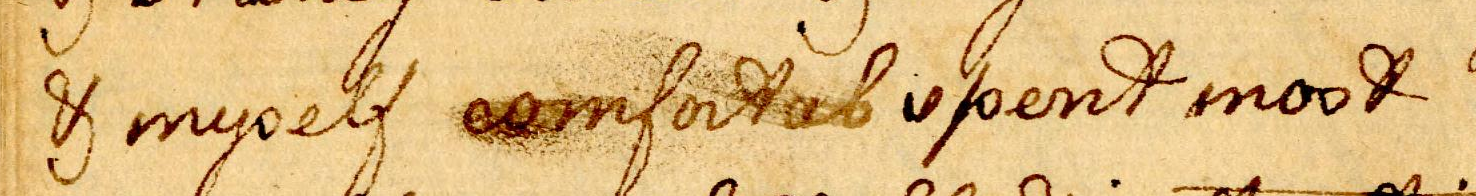& myself comfortab spent most
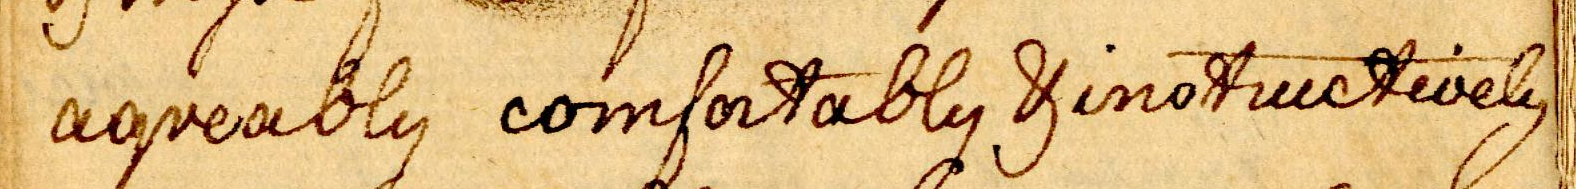agreably comfortably & instructively
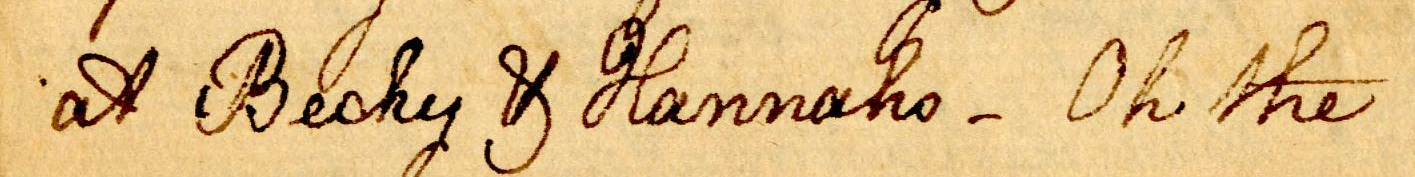at Becky & Hannahs- Oh the
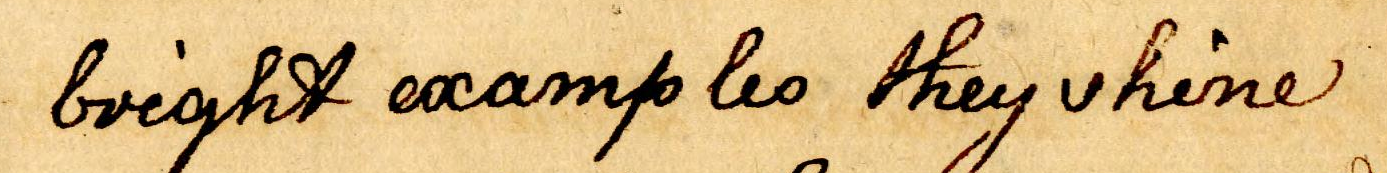bright examples they shine
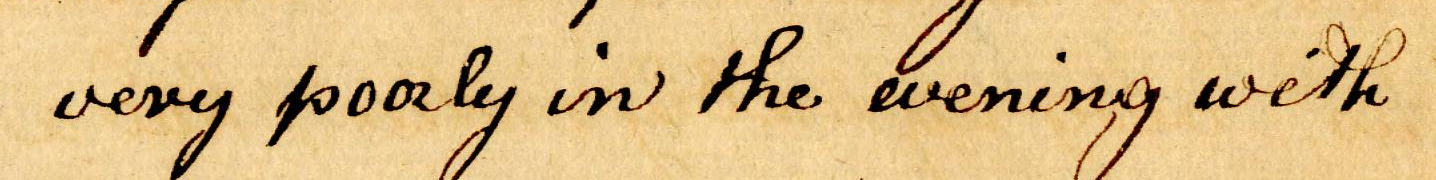very poorly in the evening with
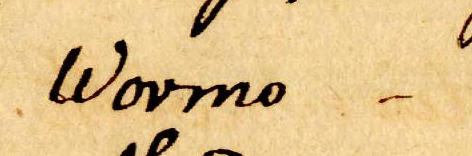Worms-
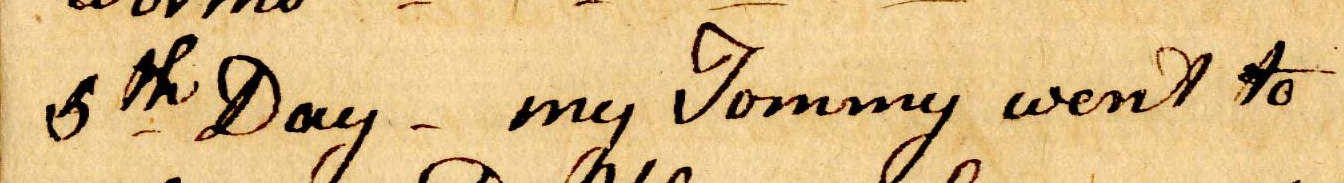5^th Day- my Tommy went to
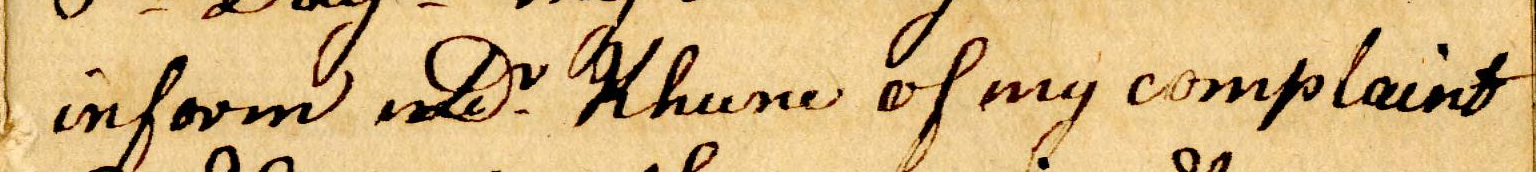inform D^r. Khune of my complaint
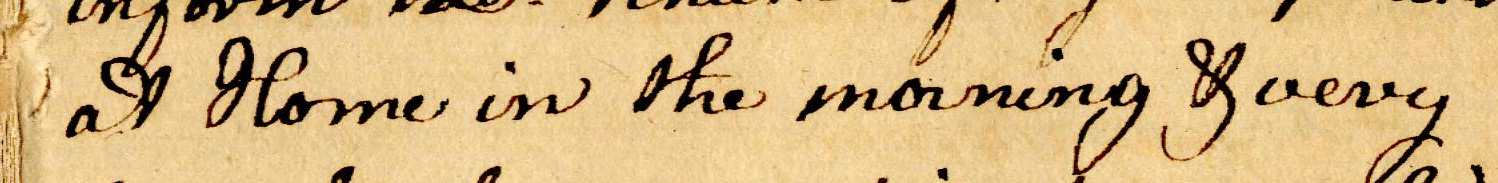at Home in the morning & very
